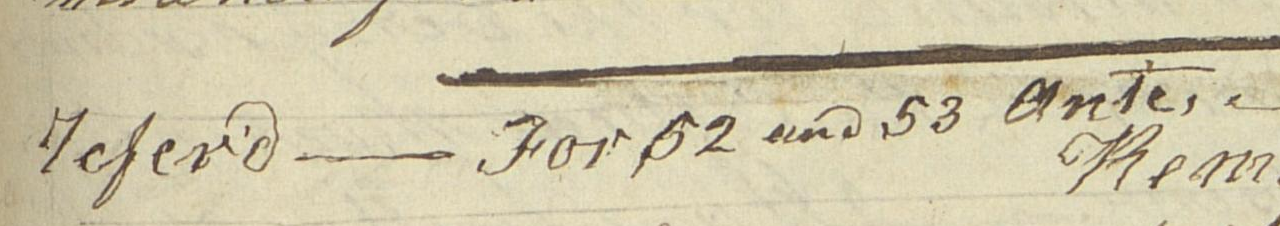Refer'd For 52 and 53 Ante,
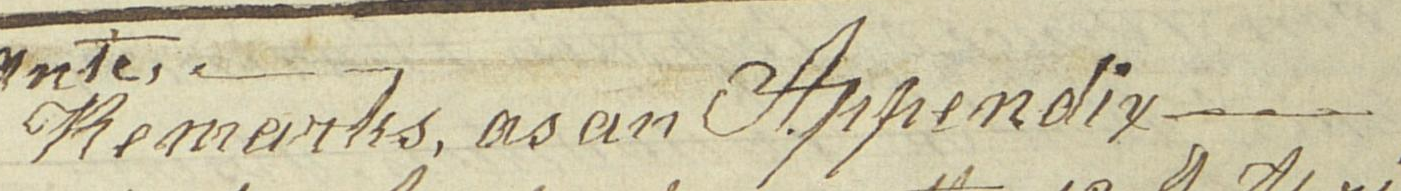Remarks, as an Appendix
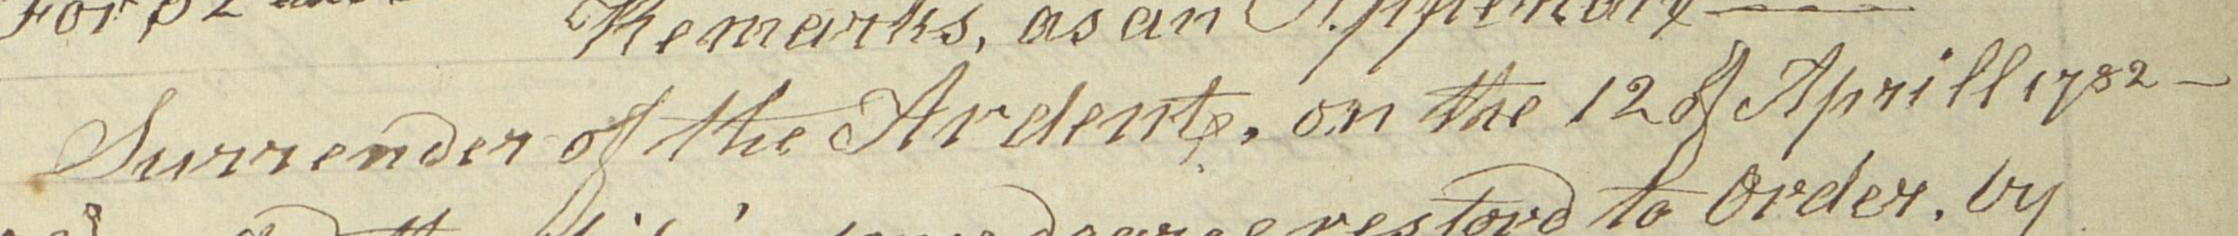Surrender of the Ardent, on the 12 of Aprill 1782
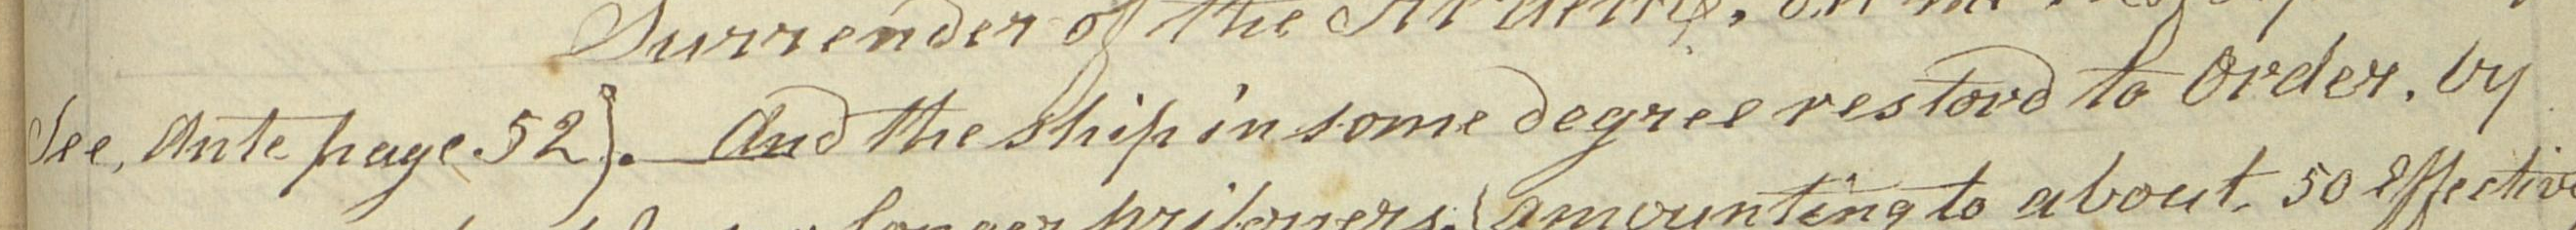See Ante page 52). And the ship in some degree restord to Order by
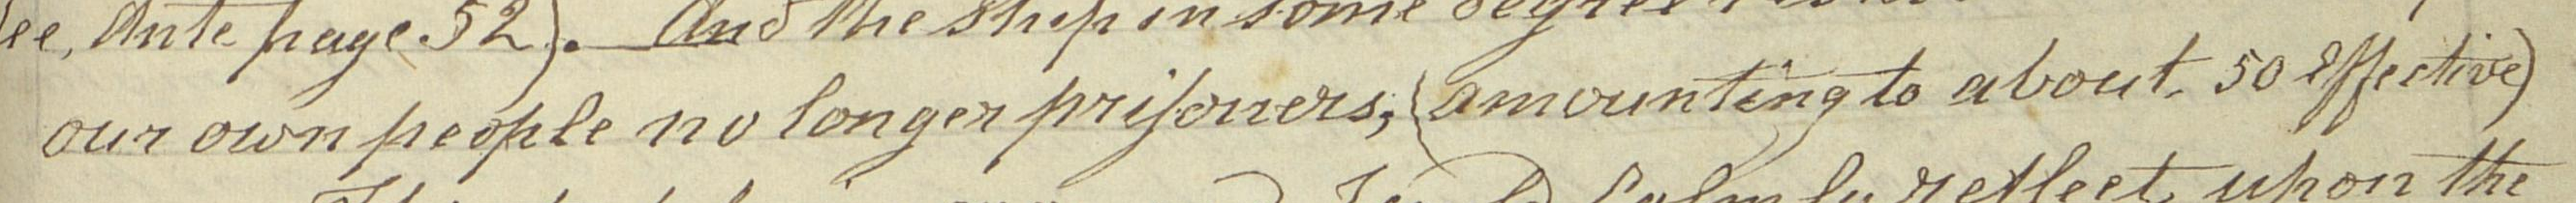our own people no longer prisoners, (amounting to about 50 effective)
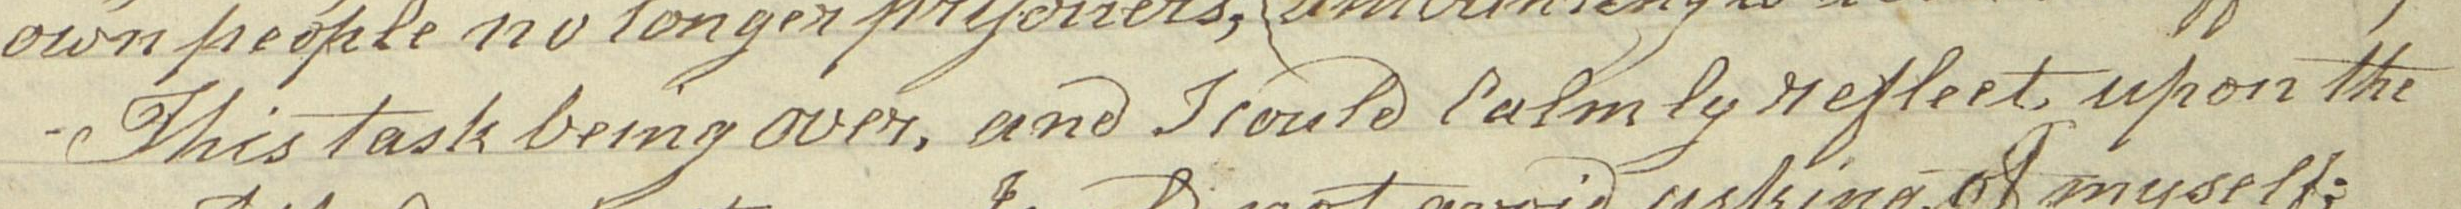This task being over, and I could calmly reflect upon the
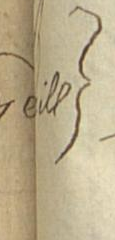-ill
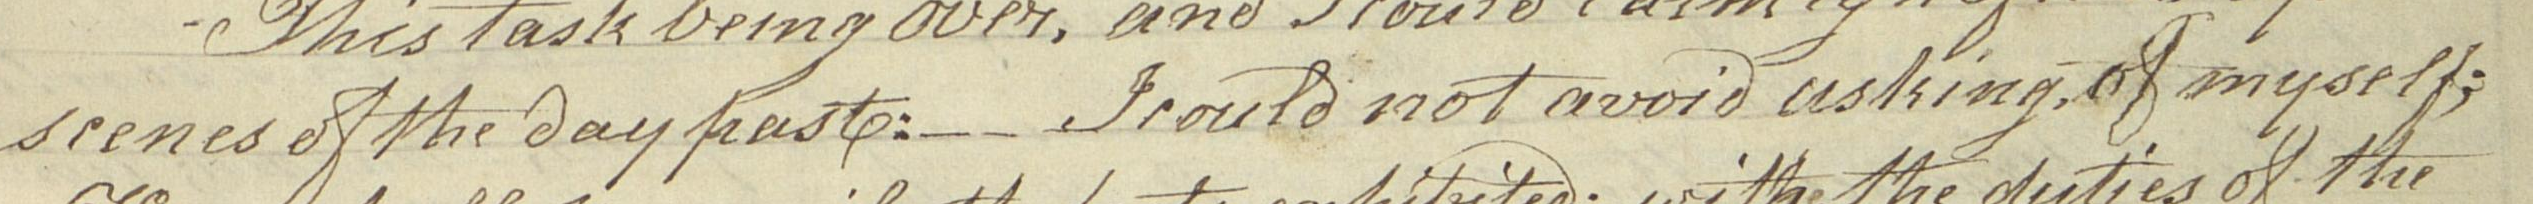scenes of the day past: I could not avoid asking of myself;
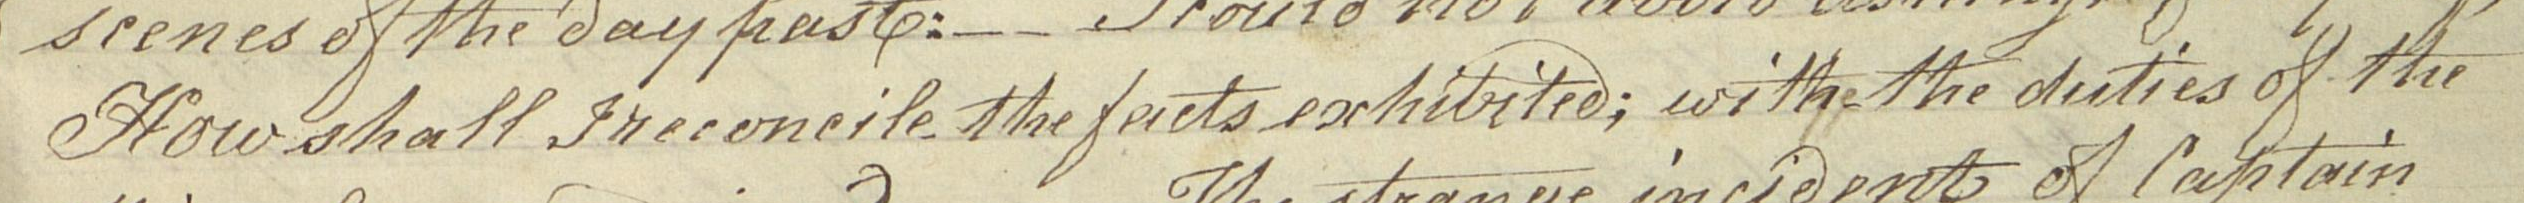How shall I reconcile the facts exhibited; with the duties of the
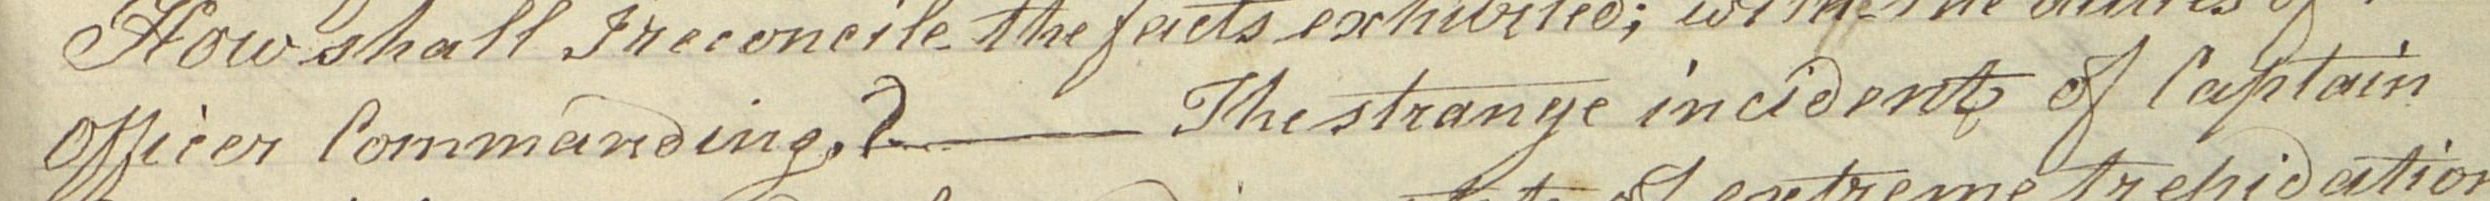Officer Commanding? The strange incident of Captain
